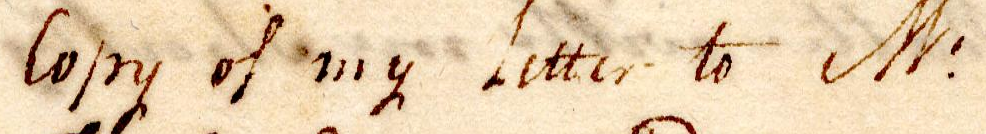Copy of my Letter to M^r.
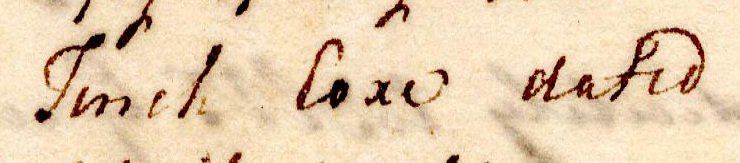Tench Coxe dated
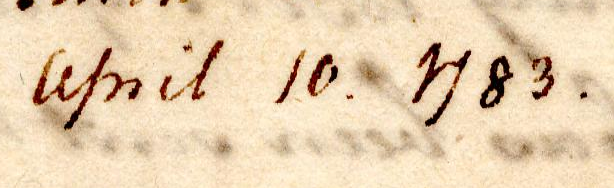April 10. 1783.
